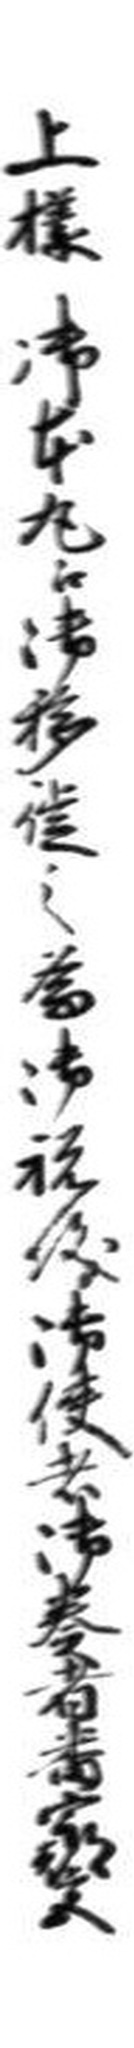上様御本丸江御移徙之為御祝儀御使者御奏者番家宮
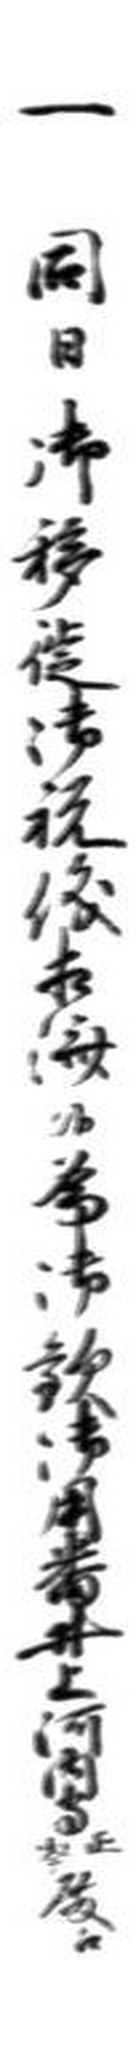一同日御移徙御祝儀相済候為御歓御用番井上河内守正岑殿江
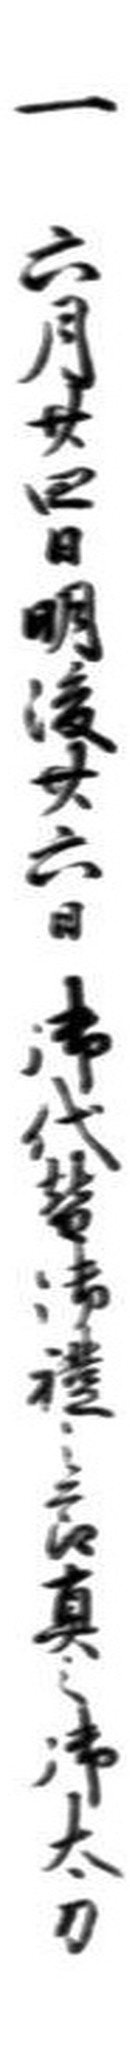一六月廿四日明後廿六日御代替御礼之節真之御太刀
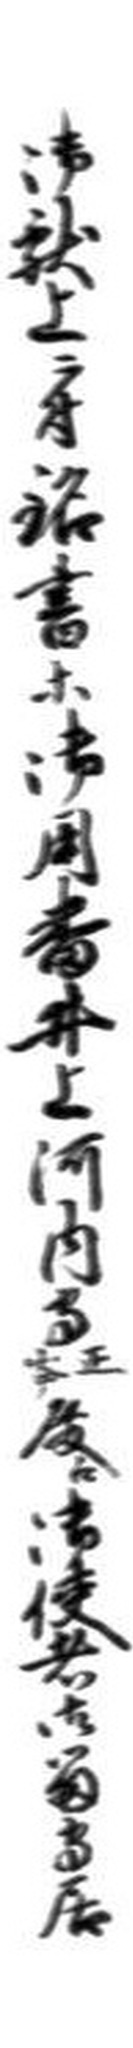御献上ニ付銘書等御用番井上河内守正岑殿江御使者御留守居
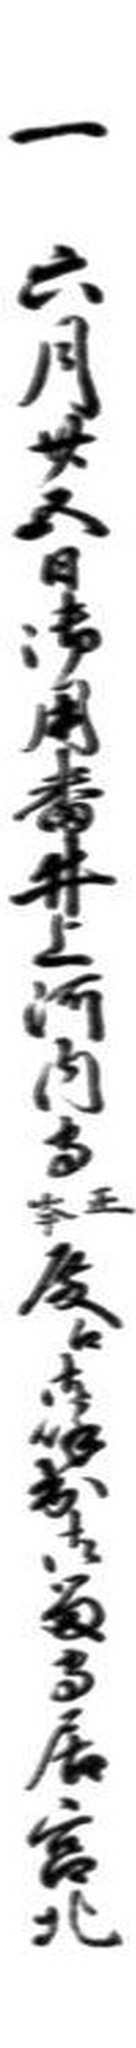一六月廿五日御用番井上河内守正岑殿江御呼出御留守居宮北
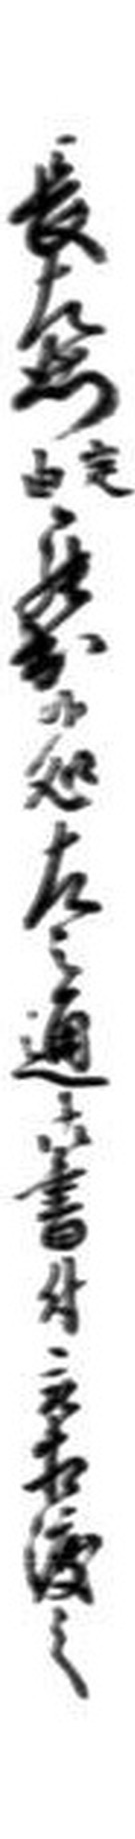長左衛門定由罷出候処左之通御書付被相渡之
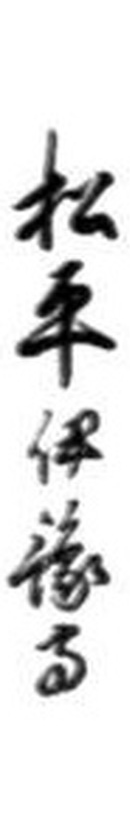松平伊予守

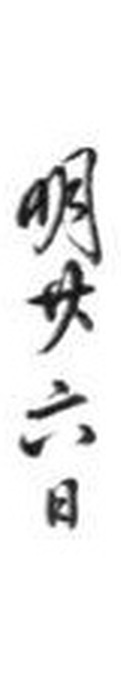明廿六日
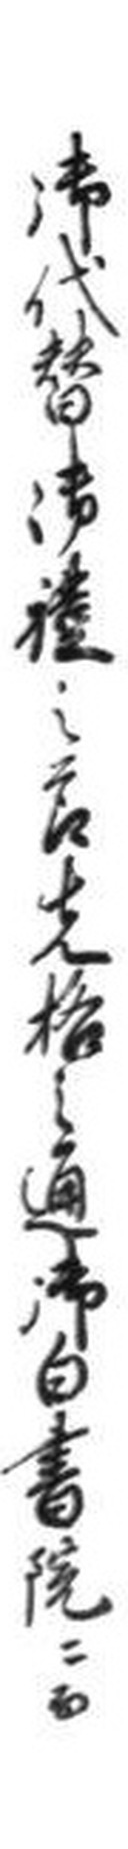御代替御礼之節先格之通御白書院ニ而
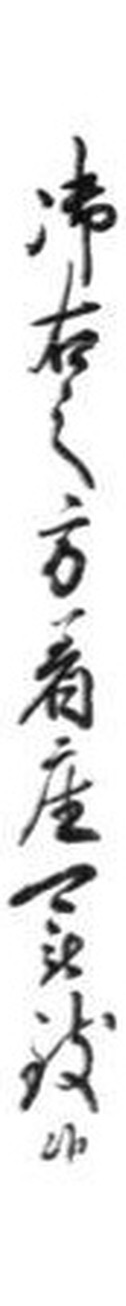御右之方着座可被致候
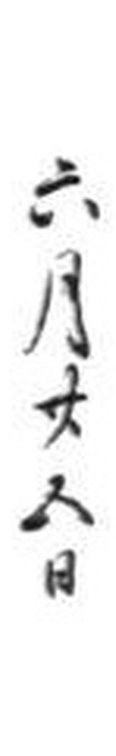六月廿五日
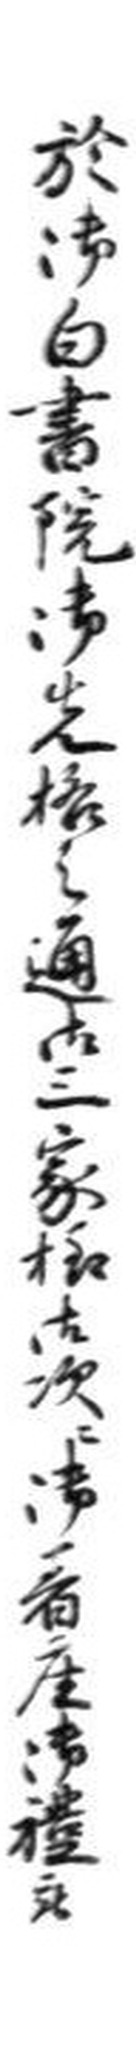於御白書院御先格之通御三家様御次ニ御着座御礼被
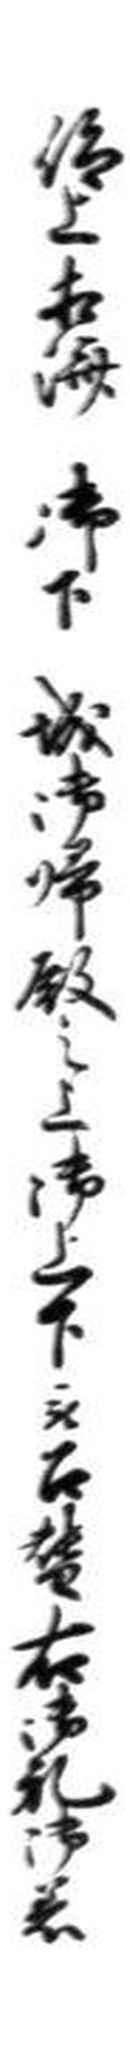仰上相済御下城御帰殿之上御上下被召替右御礼
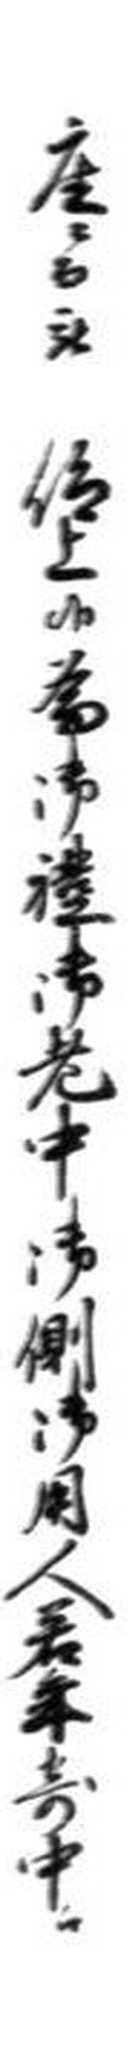座二而被仰上候為御礼御老中御側御用人若年寄中江
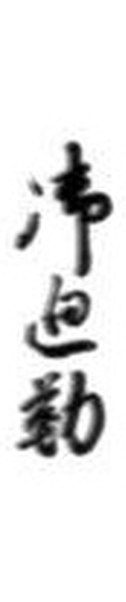御廻勤
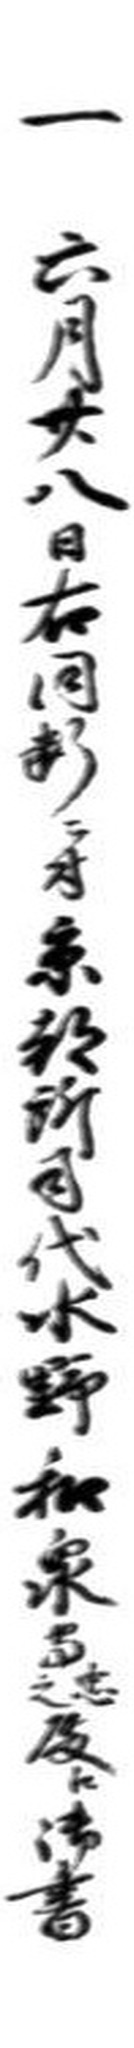一六月廿八日右同断ニ付京都所司代水野和泉守忠之殿江御書
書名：家譜 三十一 吉邦公 享保元年
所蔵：福井県文書館 Fukui Prefectural Archives
